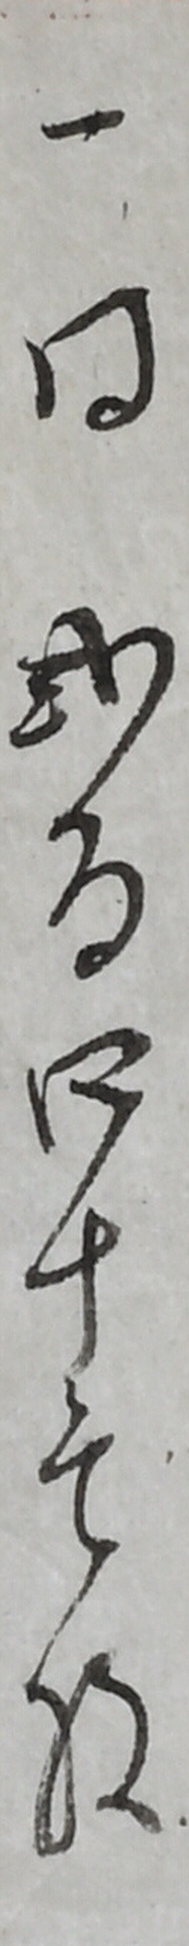一同弐百四十七枚
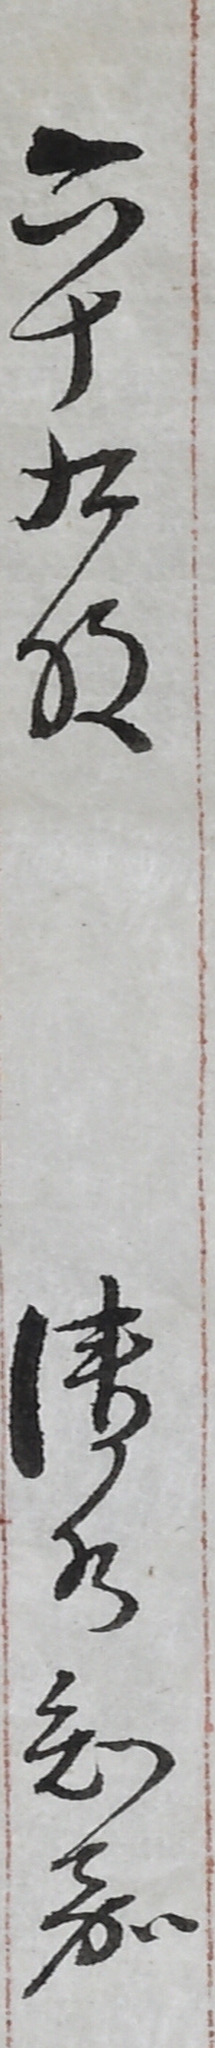六十九枚津水知嘉
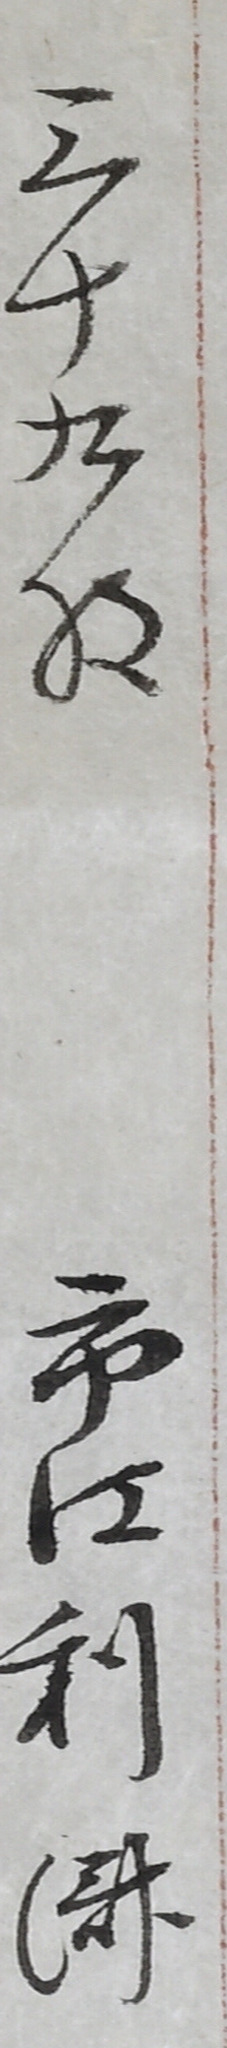三十九枚市江利渕
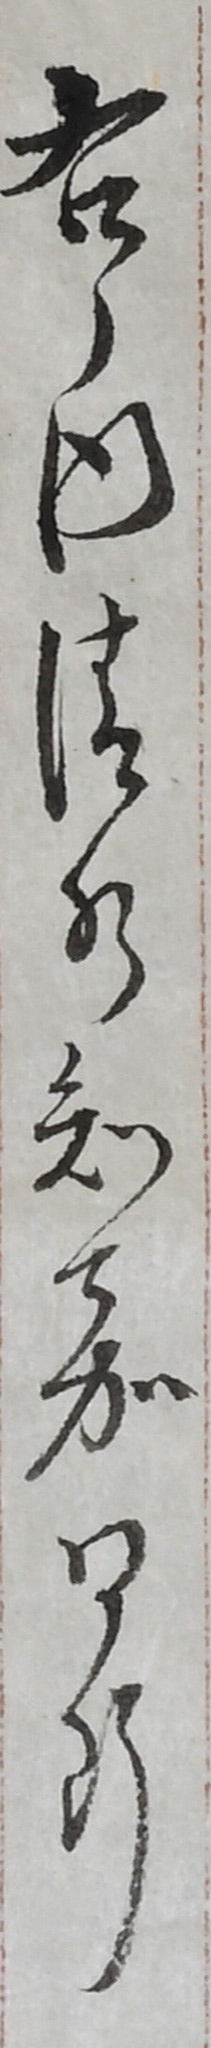右之内清水知嘉同断
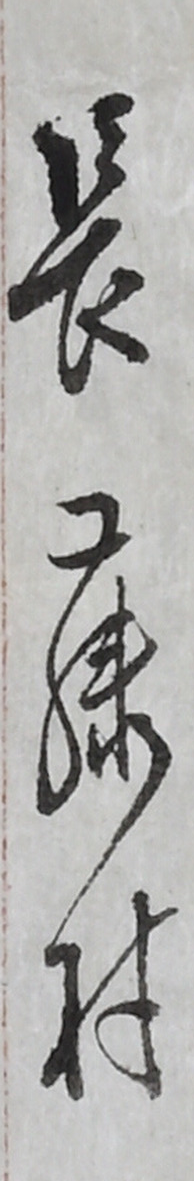長藤村
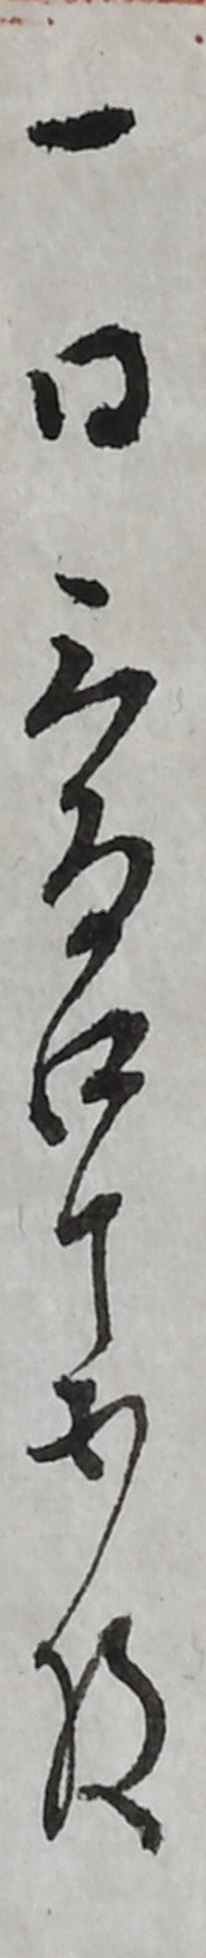一同三百四十五枚
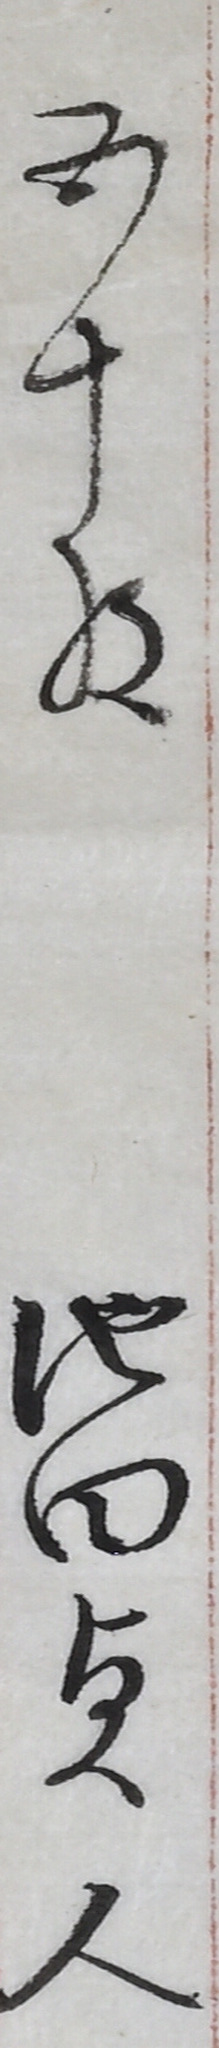五十枚池田貞人
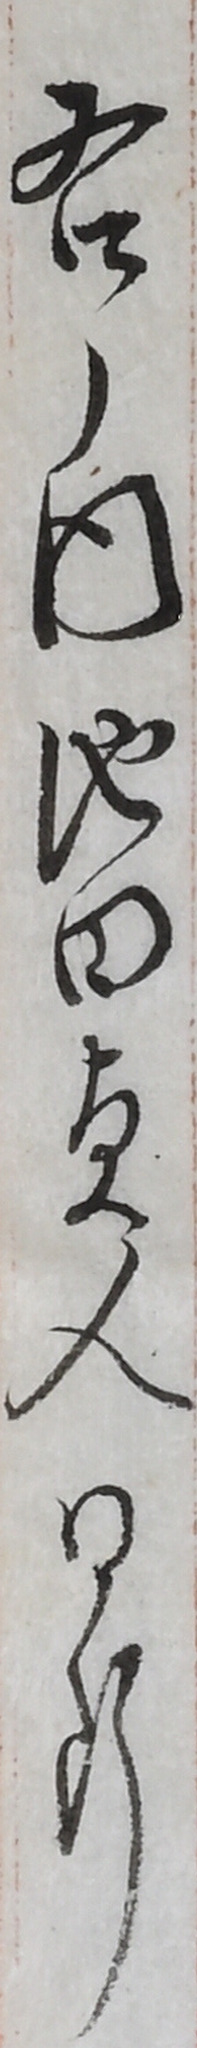右ノ内池田貞人同断
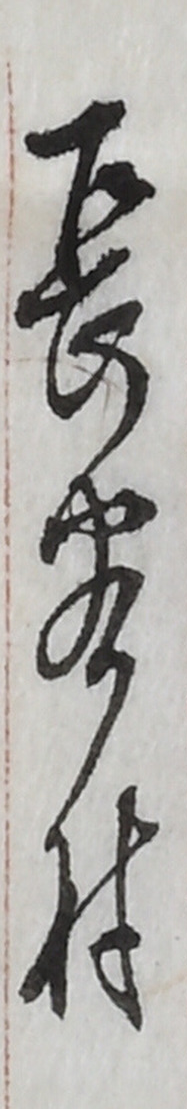長谷村
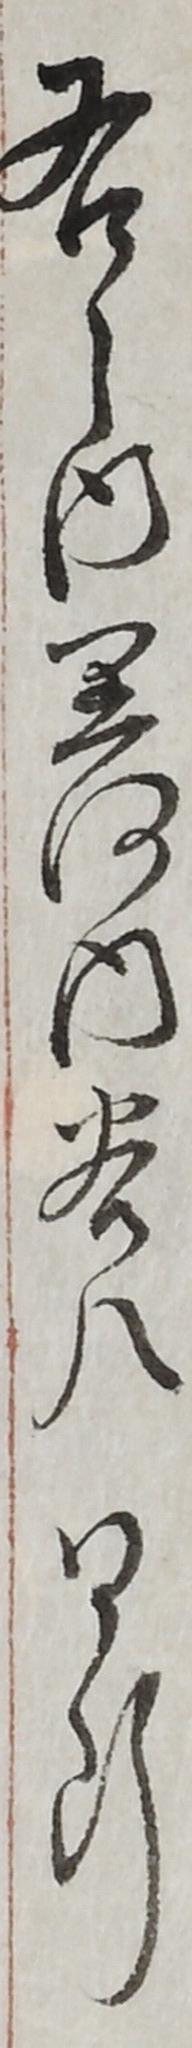右之内黒河内光八同断
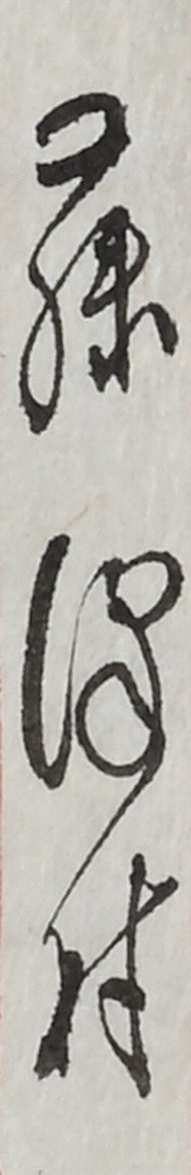藤沢村
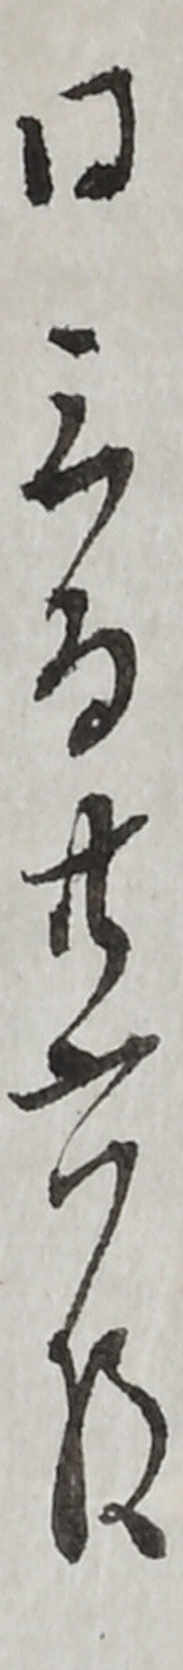一同三百廿六枚
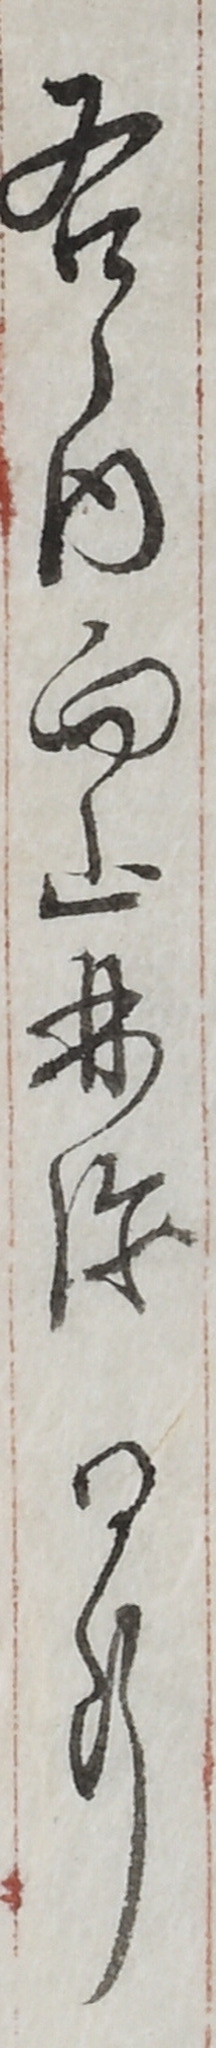右之内向山林弥同断

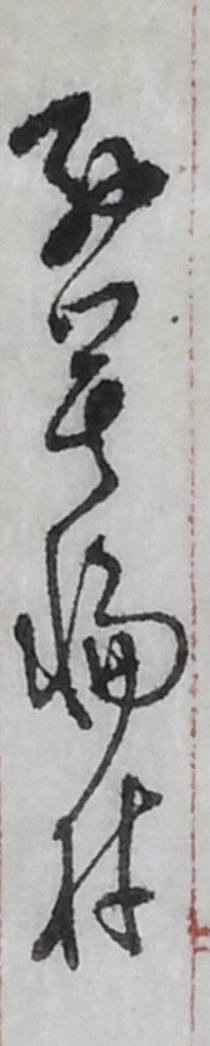西箕輪村
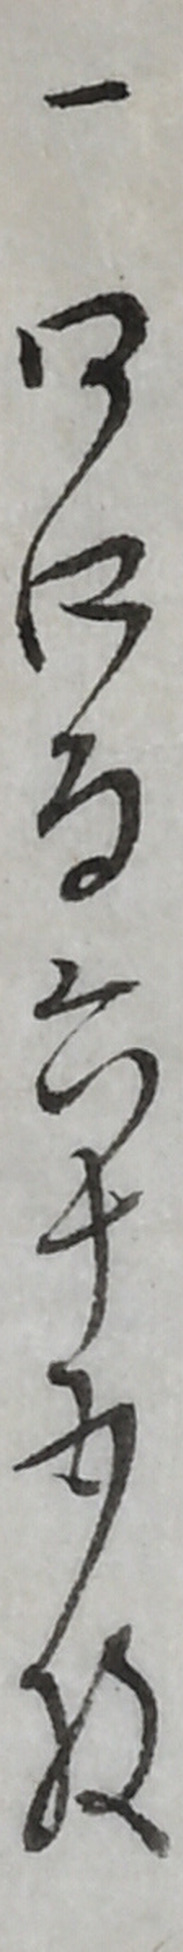一同四百六十五枚
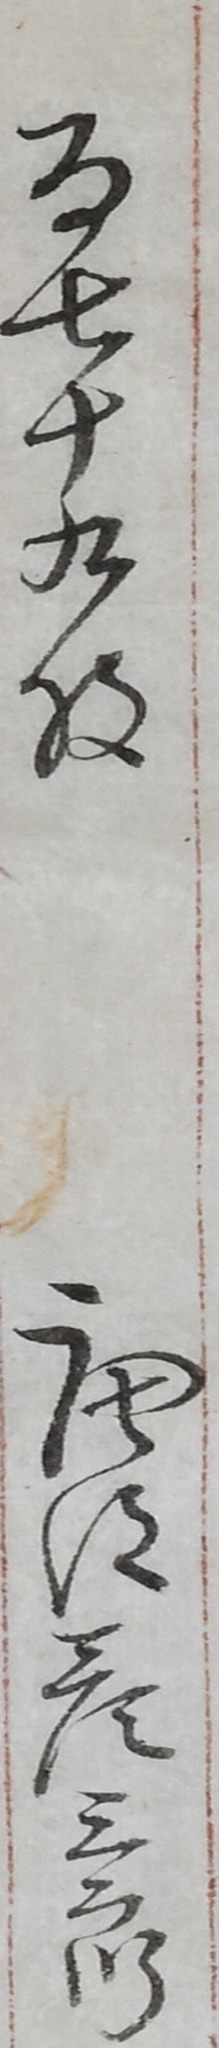百七十九枚唐沢彦三郎
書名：郡役所勤務中御用抜書
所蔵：伊那市立高遠町図書館・合同会社AMANE
